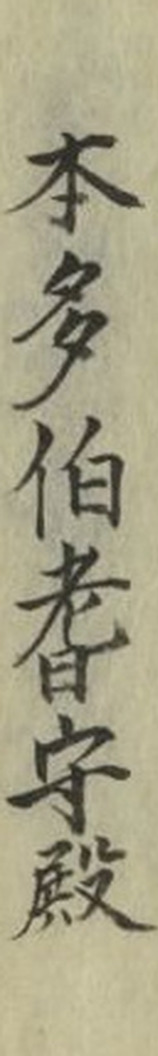本多伯耆守殿
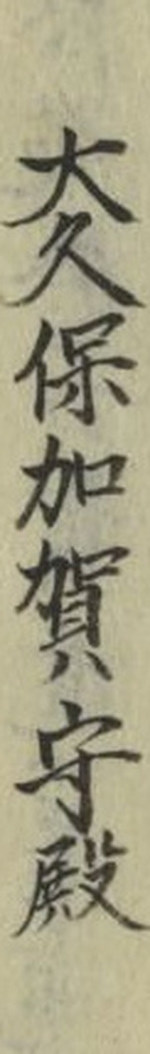大久保加賀守殿
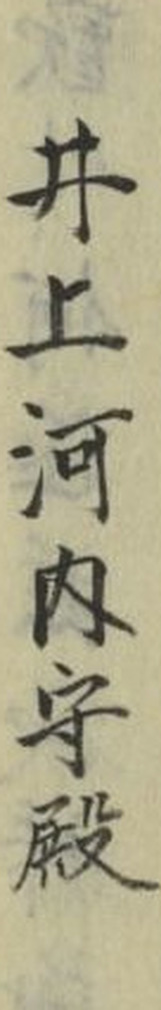井上河内守殿
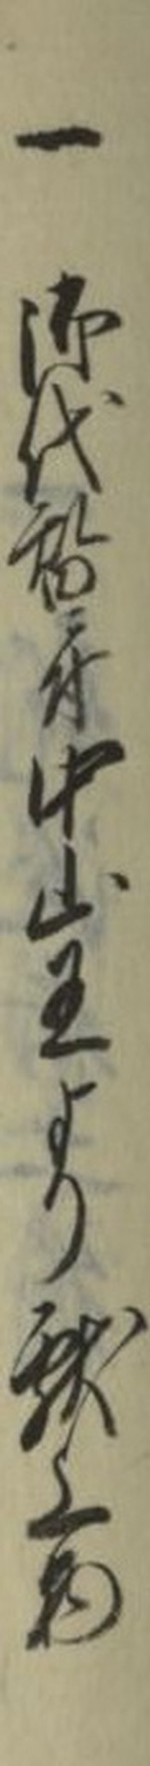一御代替に付中山王より献上物
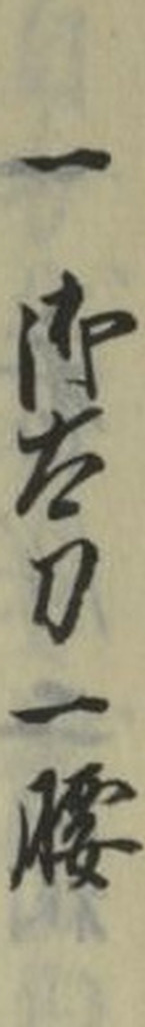一御太刀一腰
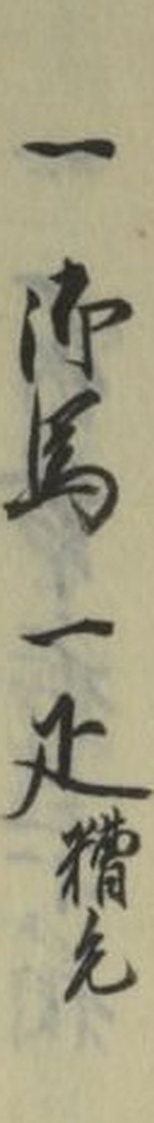一御馬一疋糟毛
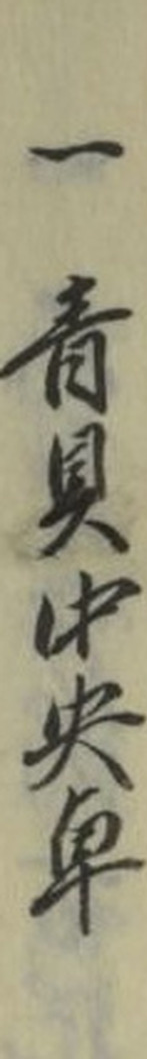一青貝中央卓
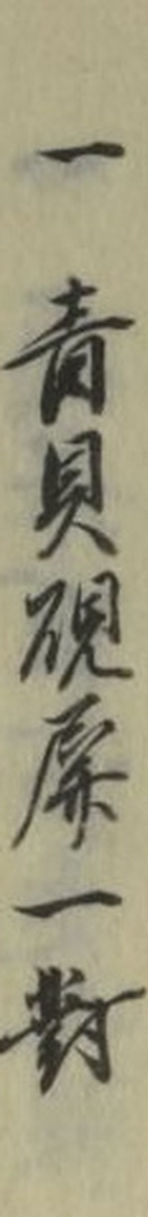一青貝硯屏一対
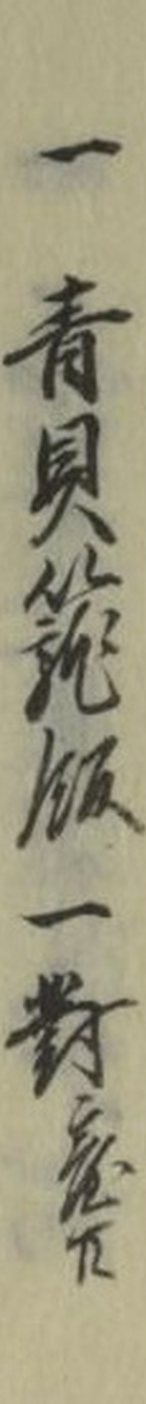一青貝籠飯一対台共
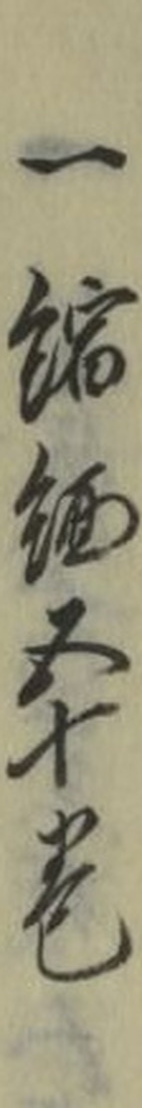一縮緬五十巻

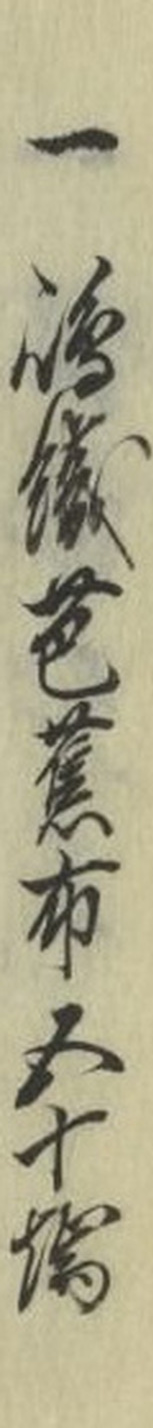一嶋織芭蕉布五十端
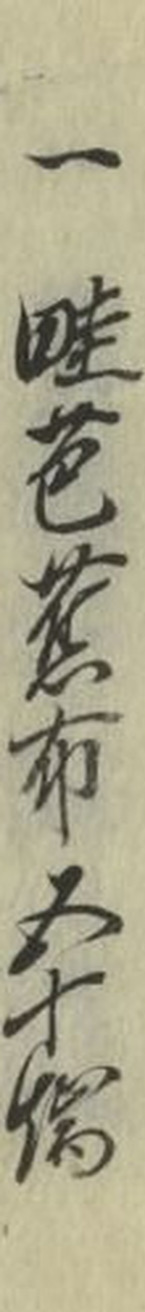一畦芭蕉布五十端
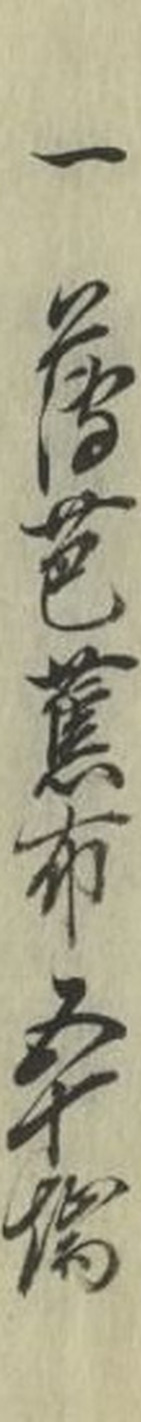一薄芭蕉布五十端
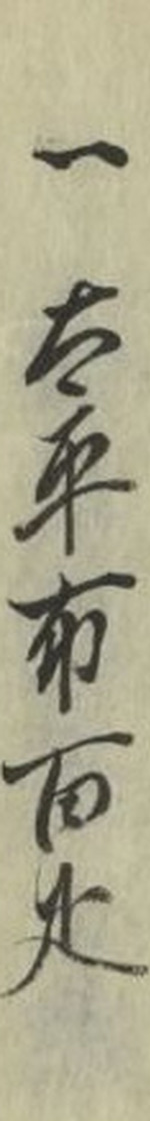一太平布百疋
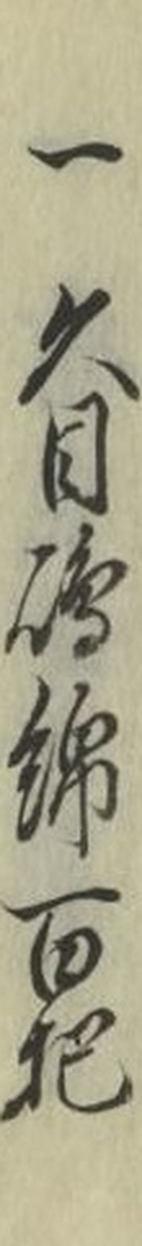一久目嶋綿百把
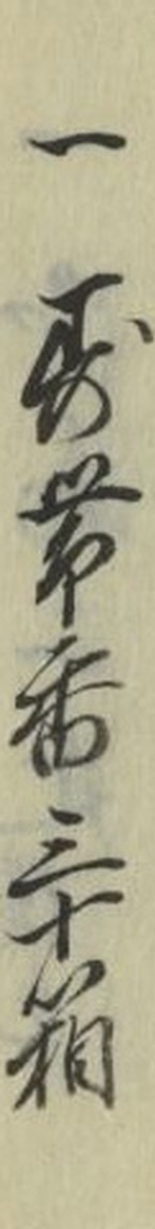一寿帯香三十箱
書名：琉球人参府記
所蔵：University of the Ryukyus Library
